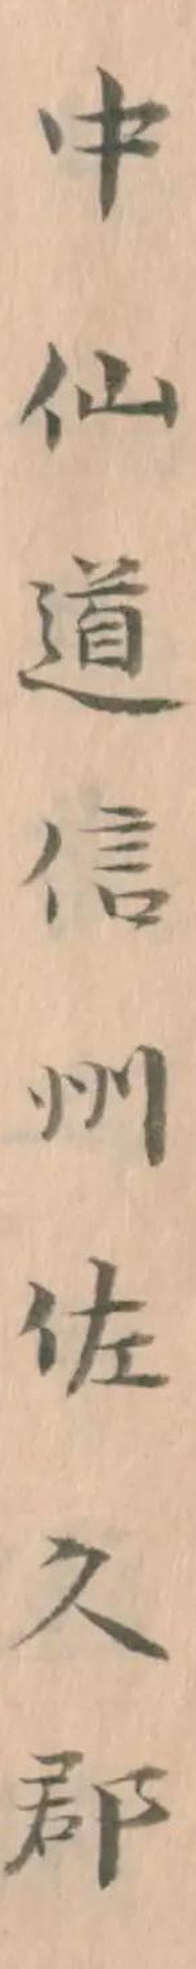中仙道信州佐久郡
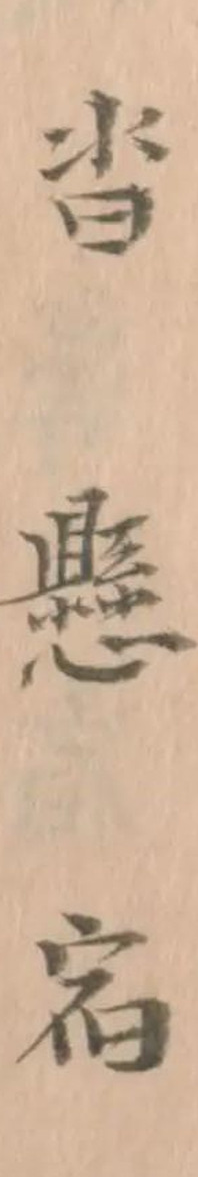沓懸宿
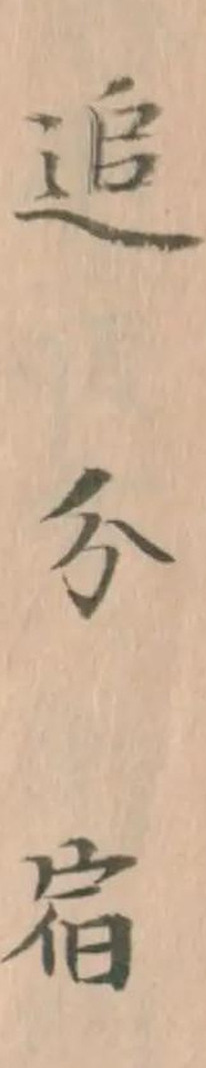追分宿
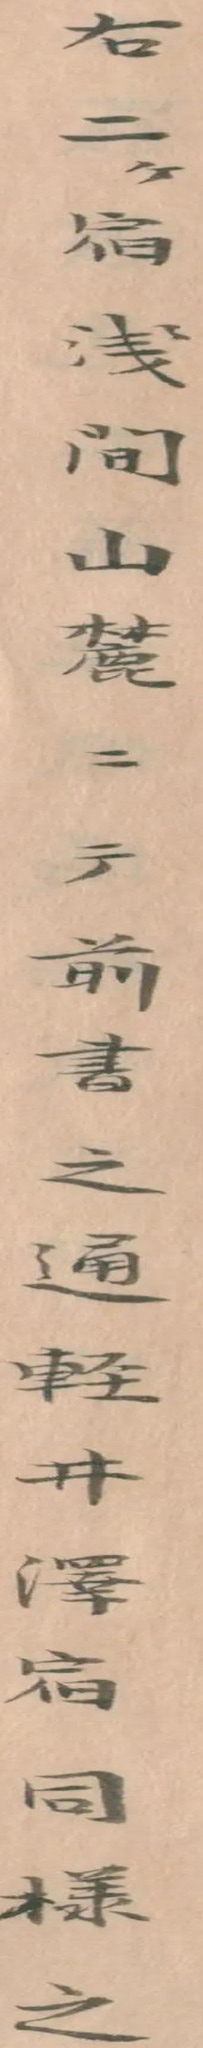右二ヶ宿浅間山麓ニテ前書之通軽井沢宿同様之
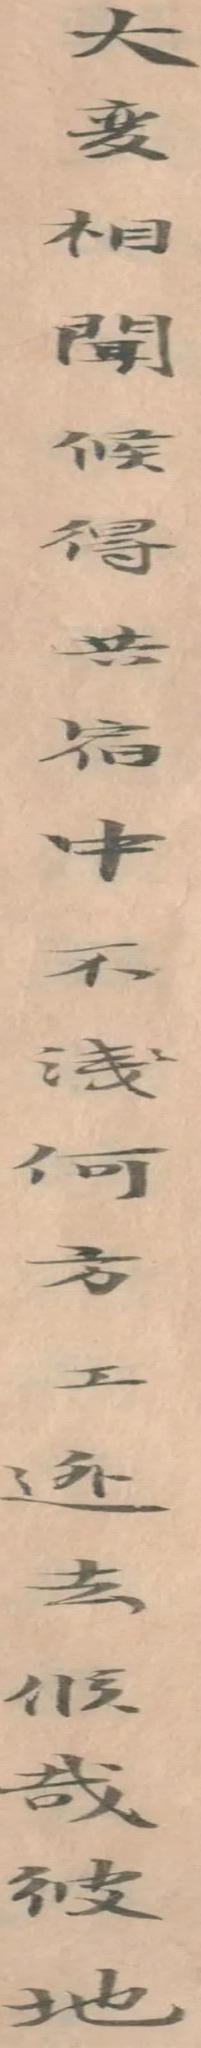大変相聞候得共宿中不浅何方エ逃去候哉彼地

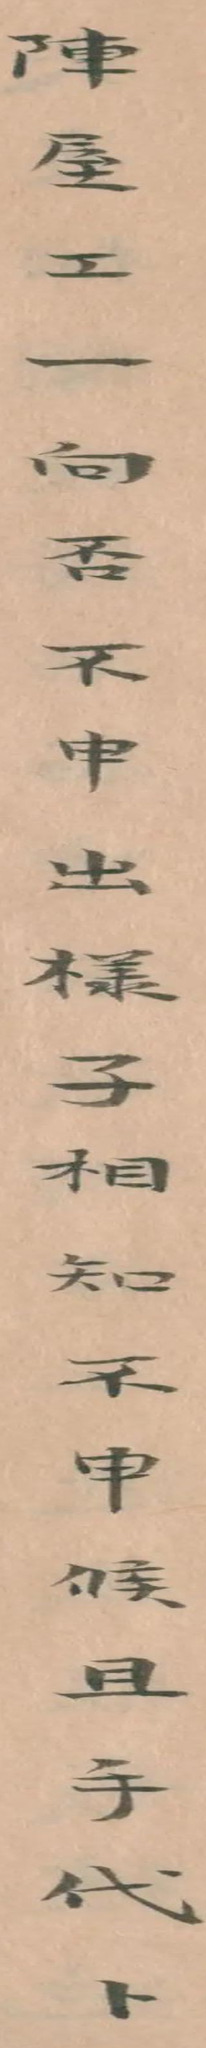陣屋エ一向否不申出様子相知不申候且手代ト
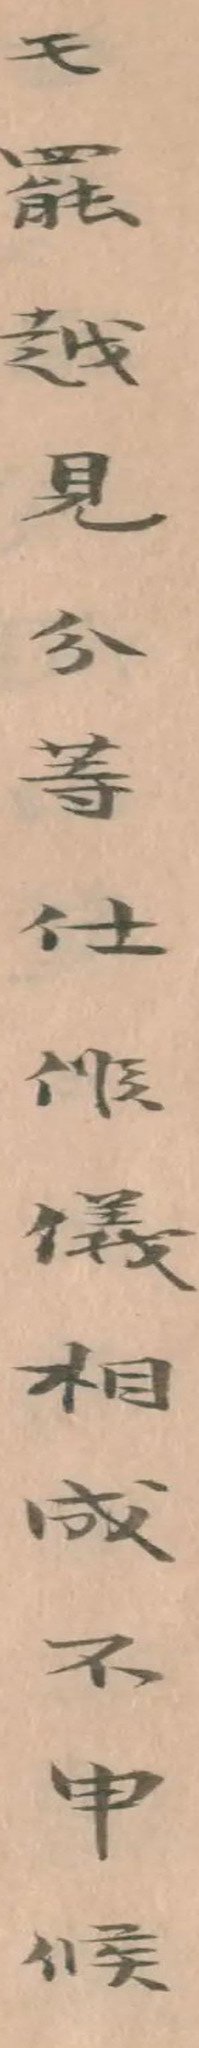モ罷越見分等仕候儀相成不申候
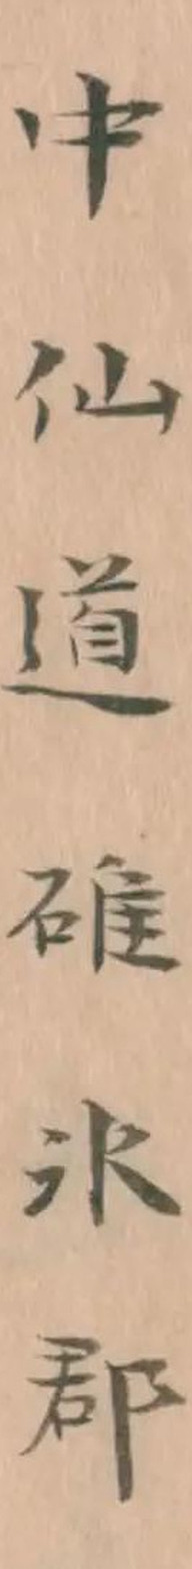中仙道碓井郡
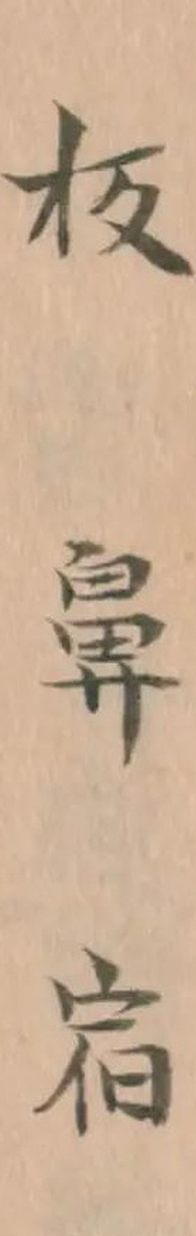板鼻宿
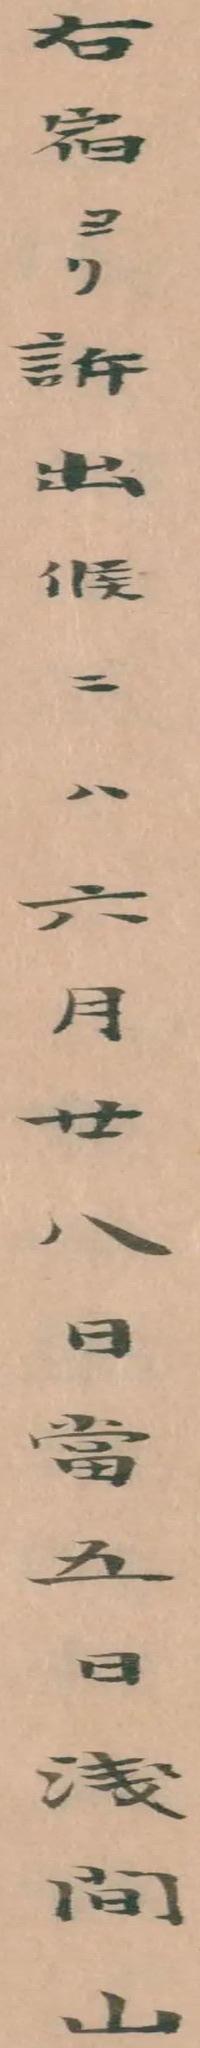右宿ヨリ訴出候ニハ六月廿八日当五日浅間山
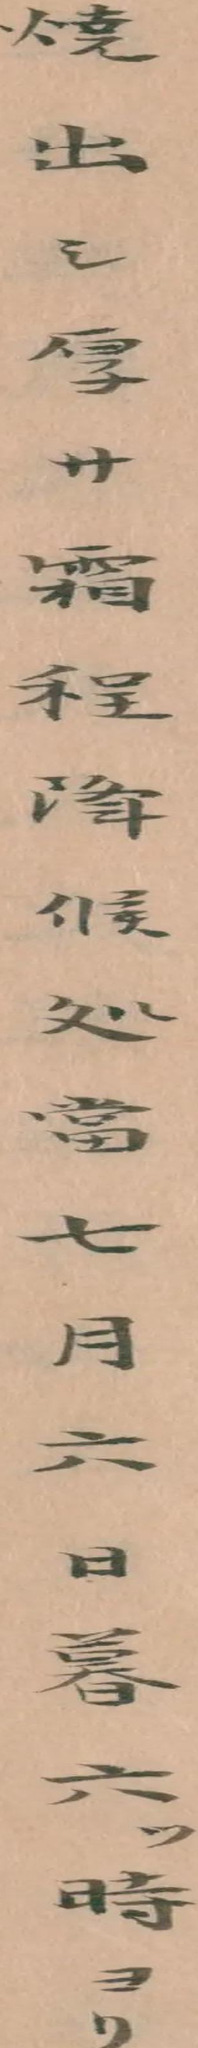焼出シ厚サ霜程降候処当七月六日暮六ッ時ヨリ
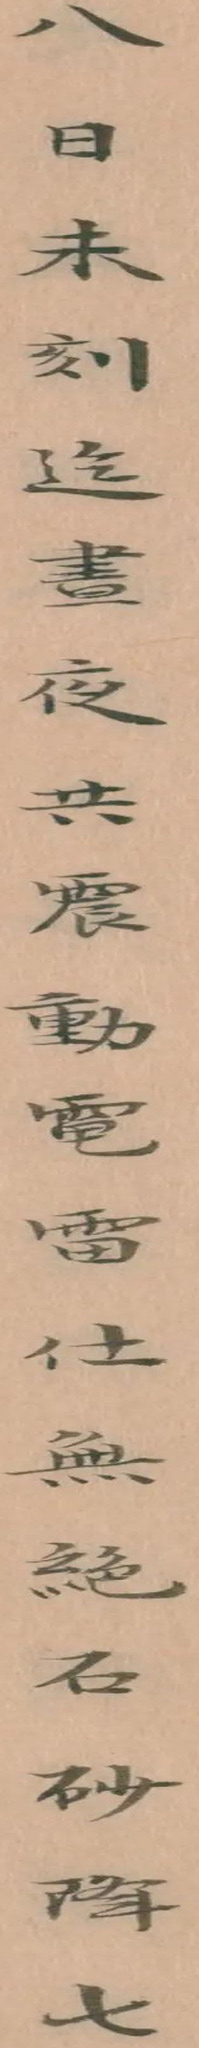八日未刻迄晝夜共震動電雷仕無絶石砂降七
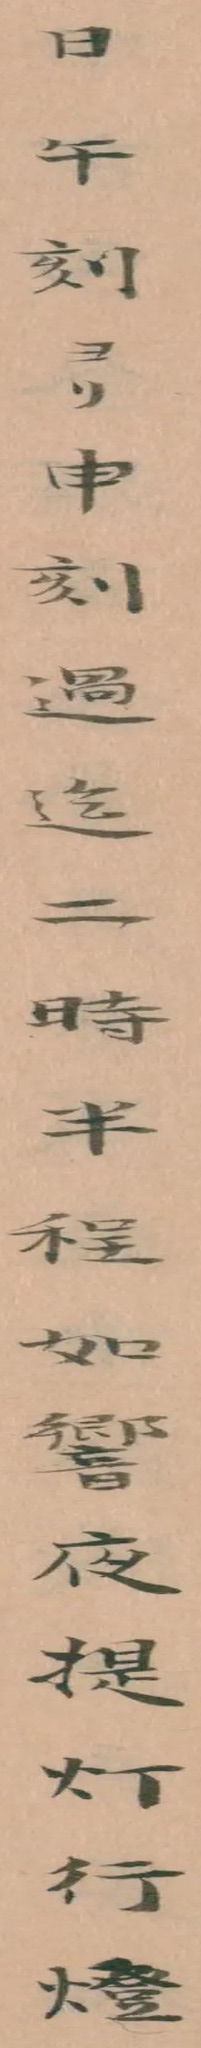日午刻ヨリ申刻過迄二時半程如響夜提灯行燈
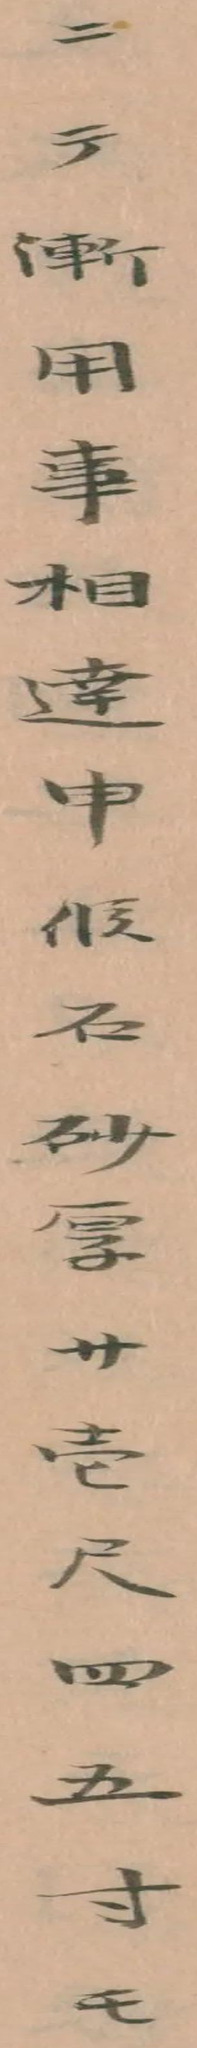ニテ漸用事事相達申候石砂厚壱尺四五寸モ
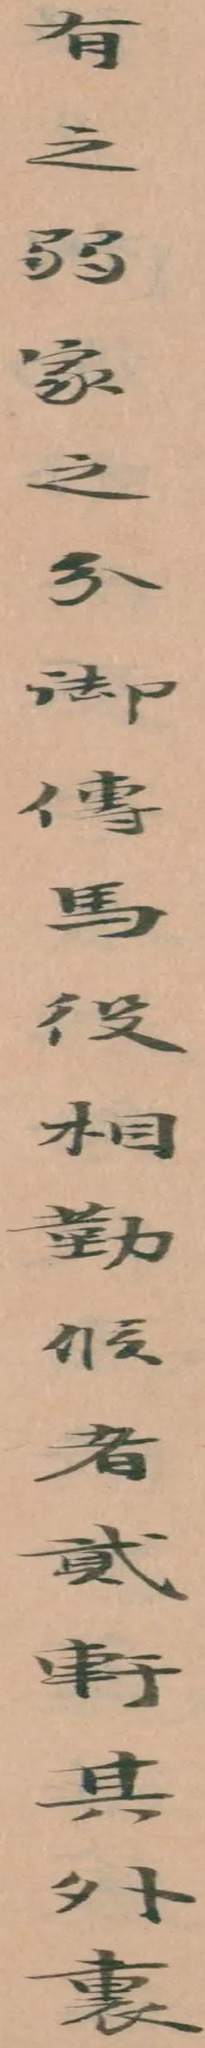有之弱家之分御伝馬役相勤候者弐軒其外裏
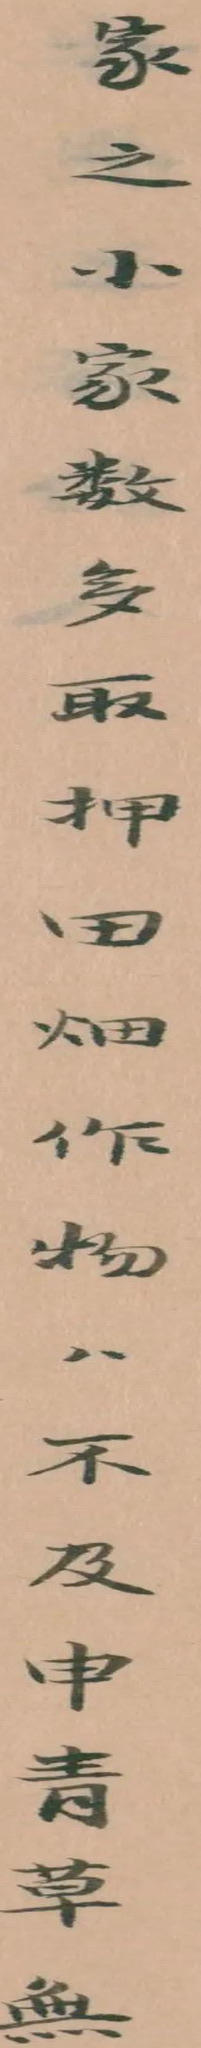家之小家数多取押田畑作物ハ不及申青草無
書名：地災撮要. 巻1(噴火山・地震ノ部)
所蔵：国立国会図書館 National Diet Library, JAPAN
